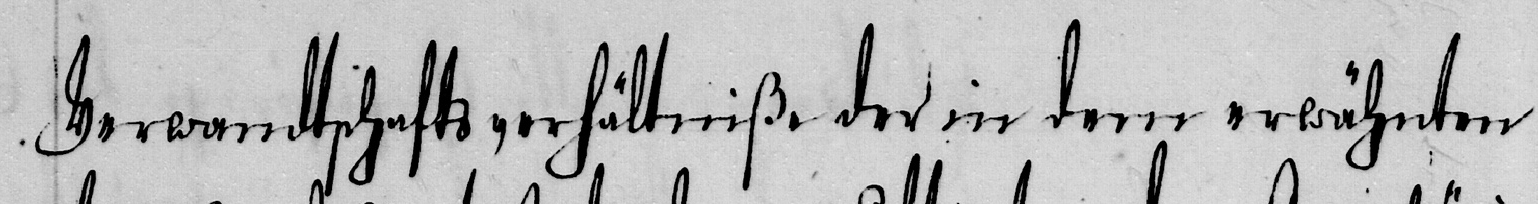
Verwandtschaftsverhältniße der in dem erwähnten
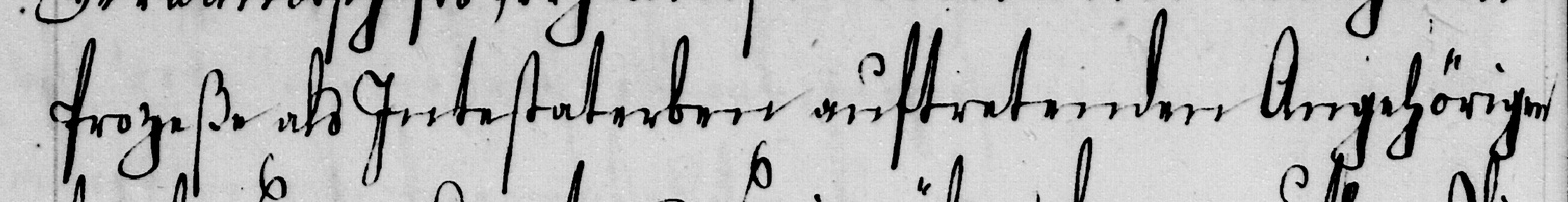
Prozeße als Intestaterben auftretenden Angehörigen
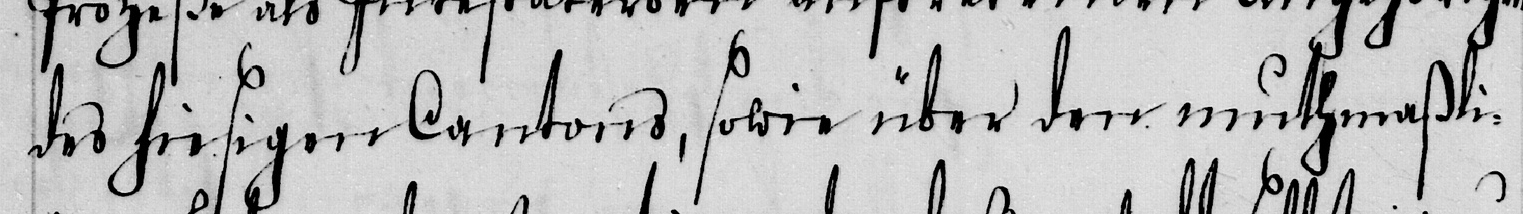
des hiesigen Cantons, sowie über den muthmaßli¬
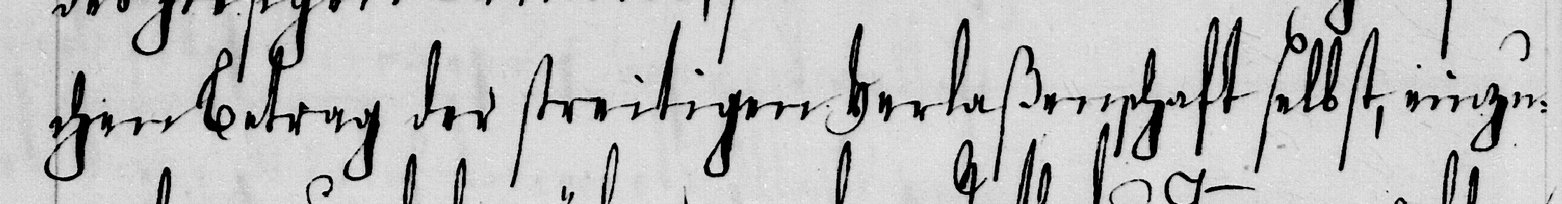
chen Bertag der streitigen Verlaßenschaft selbst, einzu¬
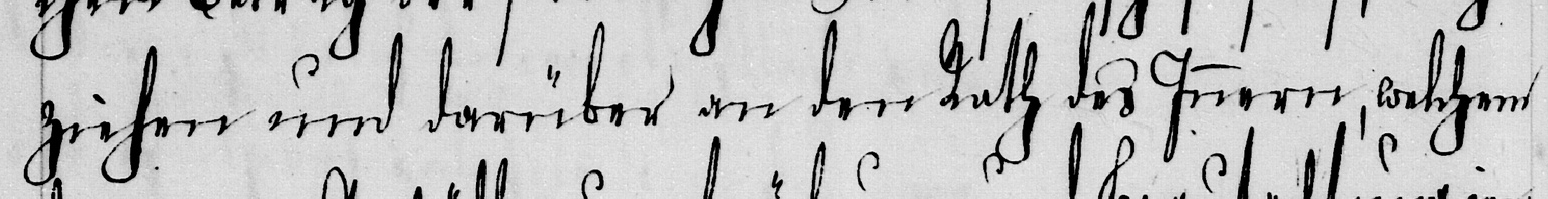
ziehen und darüber an den Rath des Innern, welchem
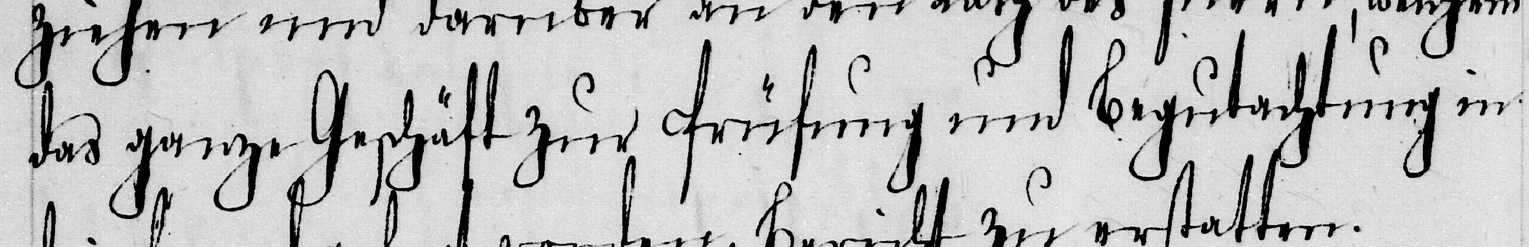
das ganze Geschäft zur Prüfung und Begutachtung in
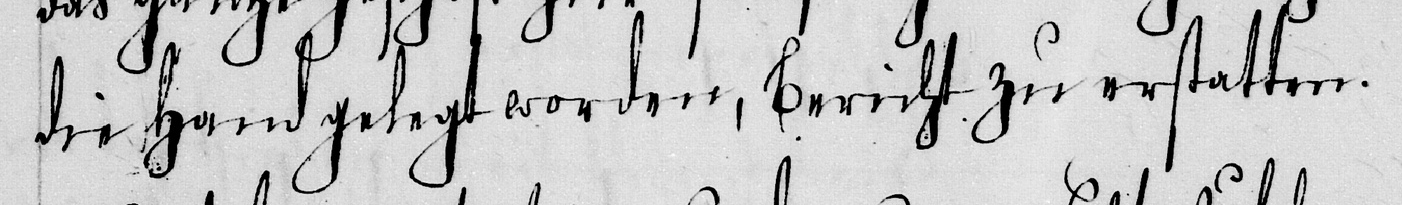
die Hand gelegt worden, Bericht zu erstatten.
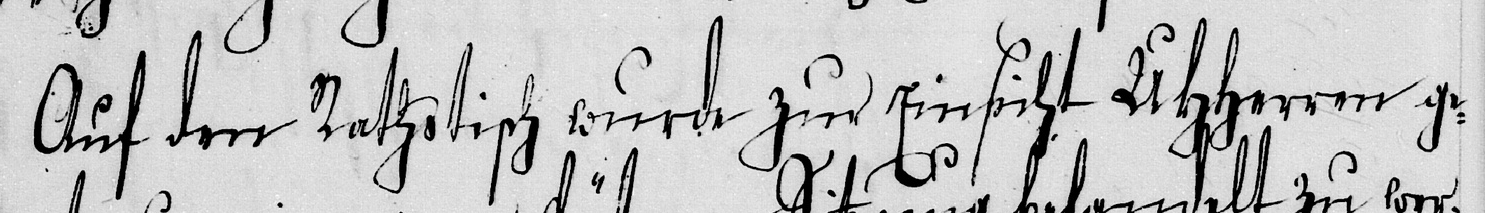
Auf den Rathstisch wurde zur Einsicht UHHerren ge¬
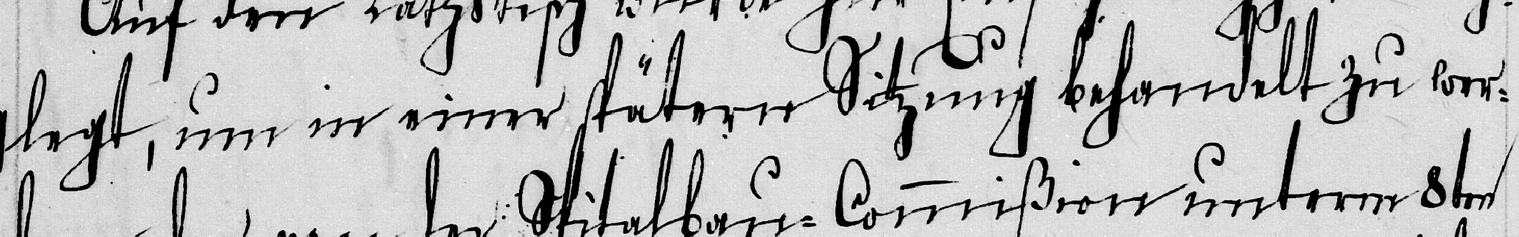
legt, um in einer spätern Sitzung behandelt zu wer¬
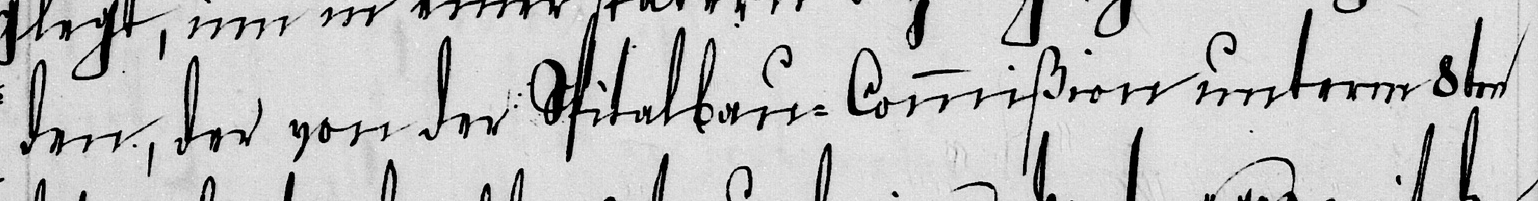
den, der von der Spitalbau-Commißion unterm 8ten
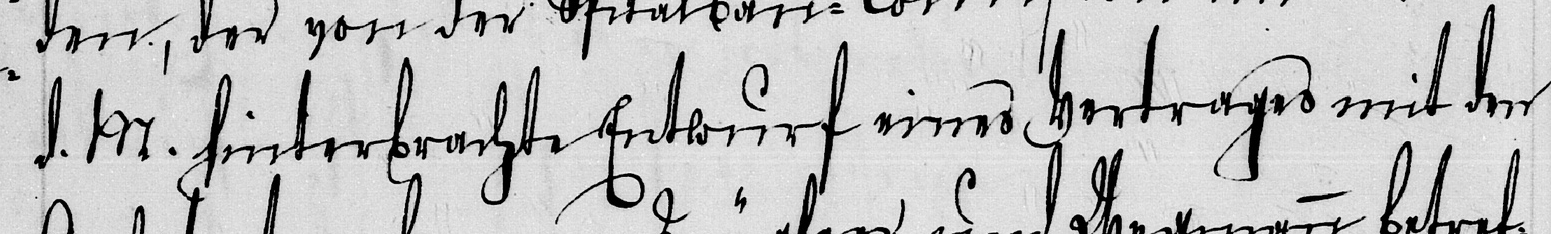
d. M. hinterbrachte Entwurf eines Vertrags mit den
